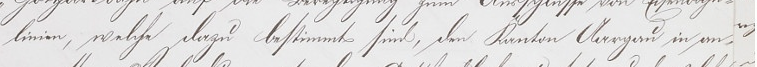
linien, welche dazu bestimmt sind, den Kanton Aargau in an-
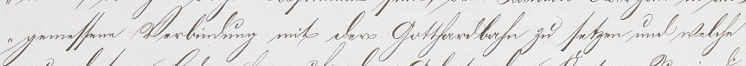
gemessene Verbindung mit der Gotthardbahn zu setzen und welche
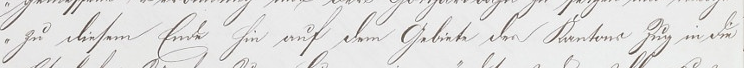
zu diesem Ende hin auf dem Gebiete des Kantons Zug in die
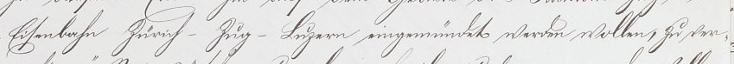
Eisenbahn Zürich–Zug–Luzern eingemündet werden wollen, zu ver-
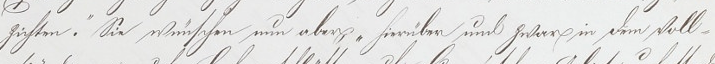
zichten.» Sie wünschen nun aber «hierüber und zwar in dem Voll-
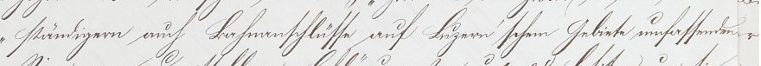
ständigern auch Bahnanschlüsse auf Luzern'schem Gebiete umfassenden
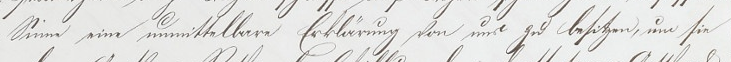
Sinne eine unmittelbare Erklärung von uns zu besitzen, um sie
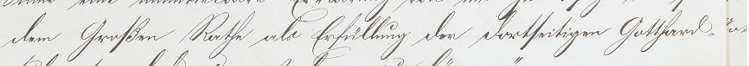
dem Großen Rathe als Erfüllung der dortseitigen Gotthard -
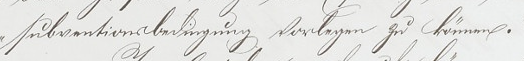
subventionsbedingung vorlegen zu können.»
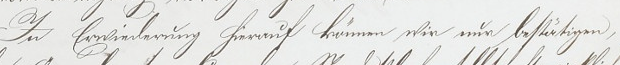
In Erwiederung hierauf können wir nur bestätigen,
